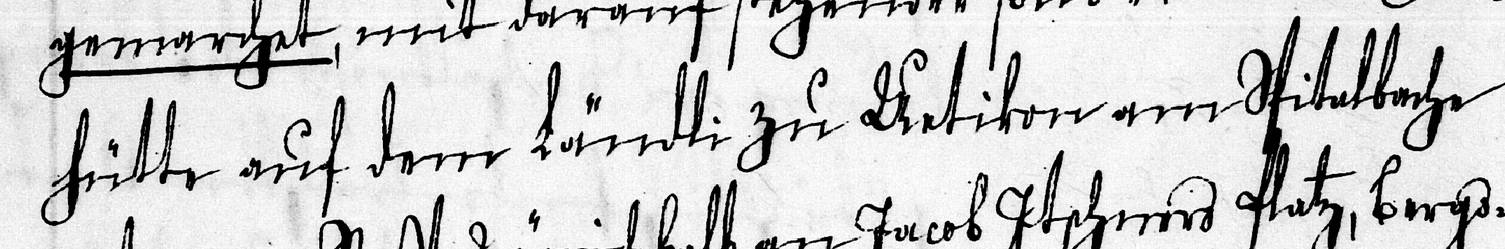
hütte auf dem Ländli zu Uetikon am Spitalbache
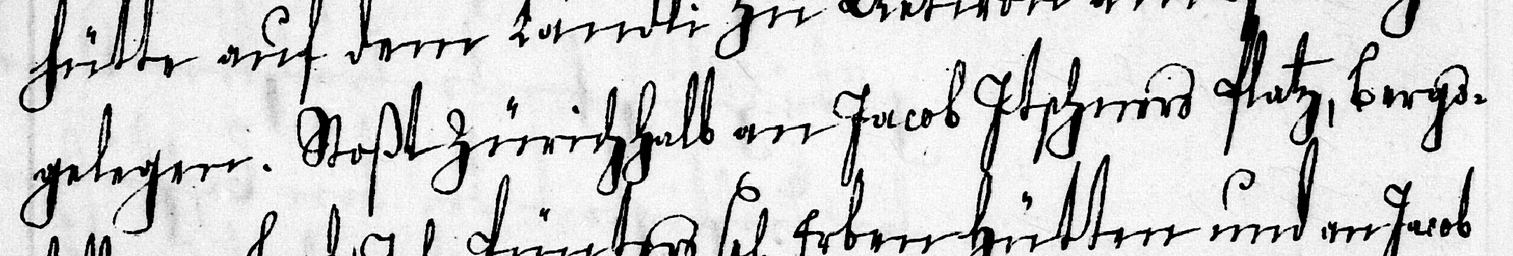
gelegen. Stoßt Zürichhalb an Jacob Itschners Platz, bergs¬
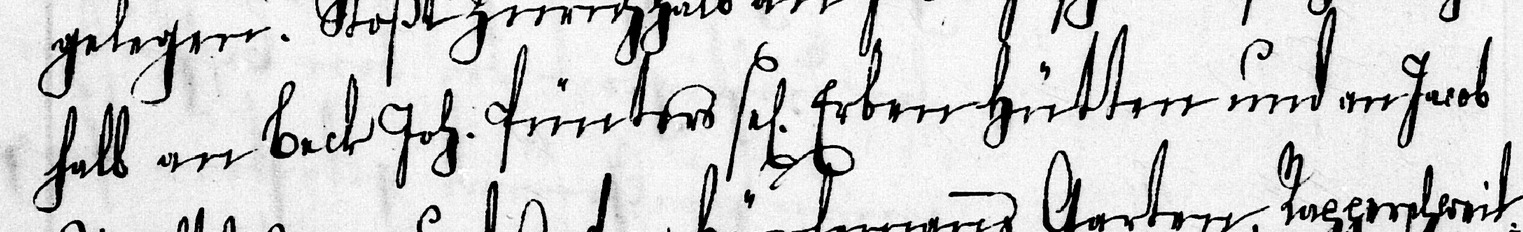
halb an Beck Joh. Pünters sel. Erben Hütten und an Jacob
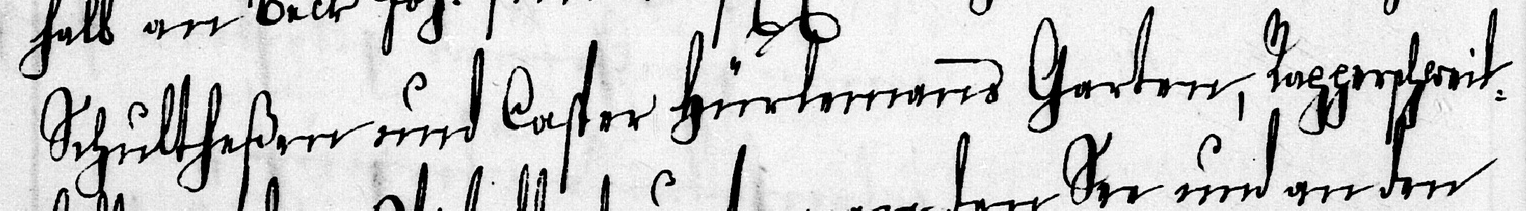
Schultheßen und Caspar Hürlemanns Garten, Rapperschwe¬
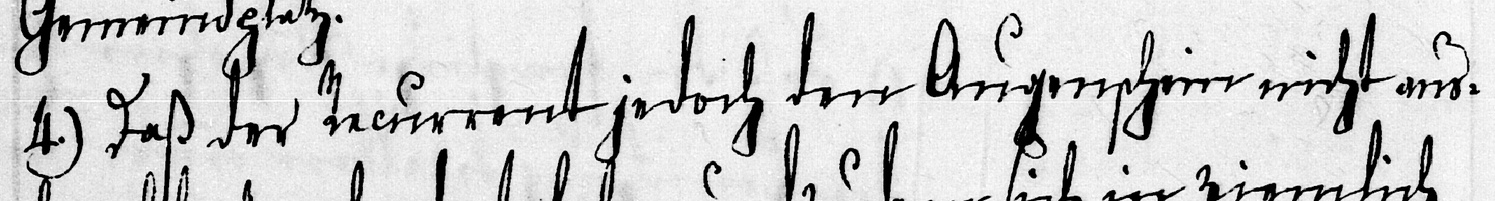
4.) Daß der Recurrent jedoch den Augenschein nicht aus¬
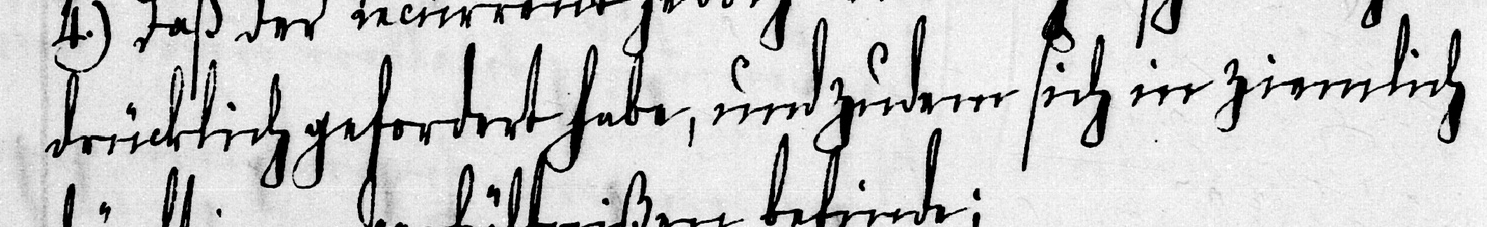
drücklich gefordert habe, und zudem sich in ziemlich
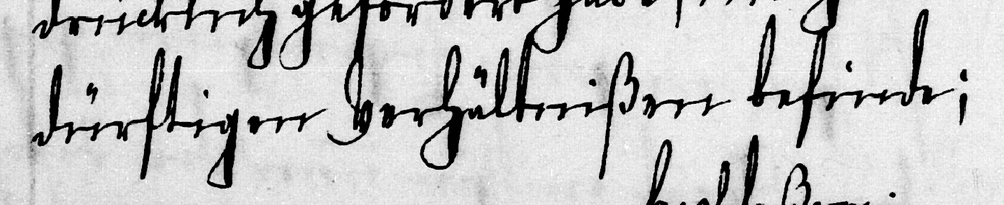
dürftigen Verhältnißen befinde;
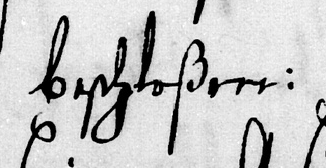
beschloßen:
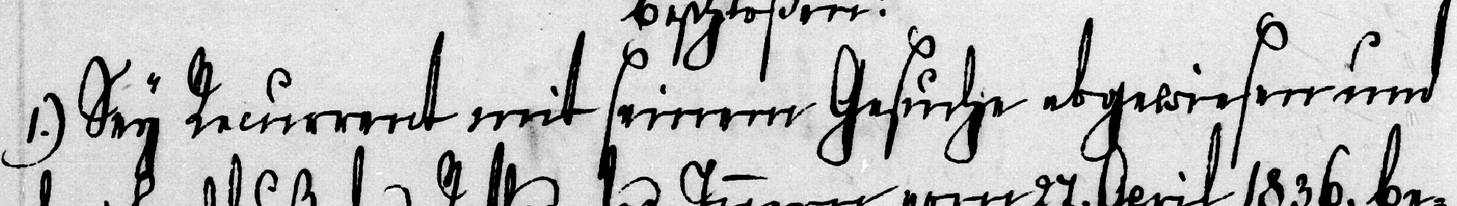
1.) Sey Recurrent mit seinem Gesuche abgewiesen und
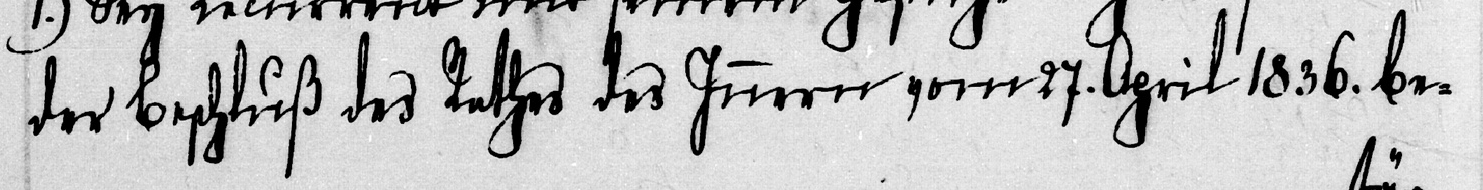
der Beschluß des Rathes des Innern vom 27. April 1836. be-
